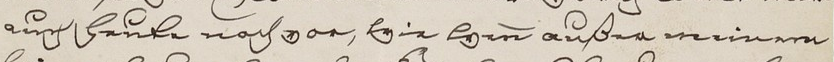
auch heute noch vor, wie wenn außer meinem
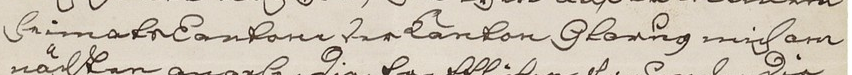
Heimatskantone der Kanton Glarus mich am
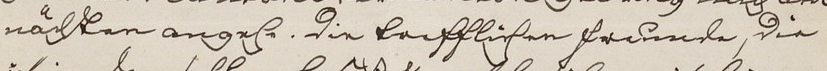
nächsten angehe. Die trefflichen Freunde, die
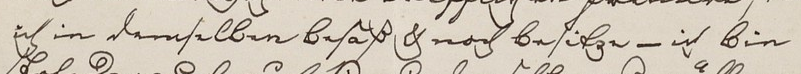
ich in demselben besaß & noch besitze – ich bin
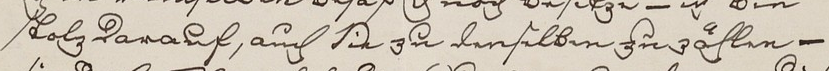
stolz darauf, auch Sie zu denselben zu zählen –
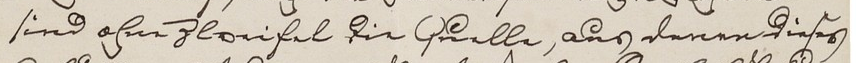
sind ohne Zweifel die Quelle, aus denen dieses
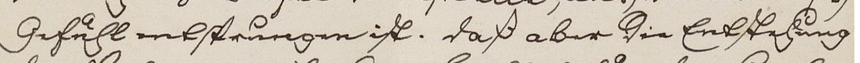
Gefühl entsprungen ist. Daß aber die Entstehung
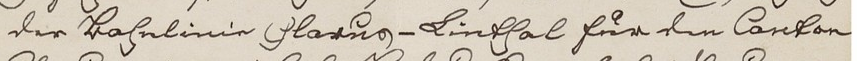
der Bahnlinie Glarus–Linthal für den Canton
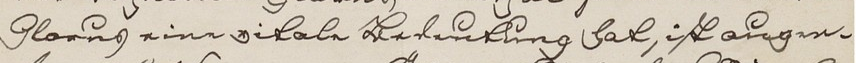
Glarus eine vitale Bedeutung hat, ist augen-
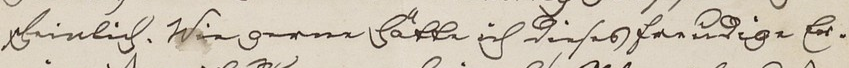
scheinlich. Wie gerne hätte ich dieses freudige Er-
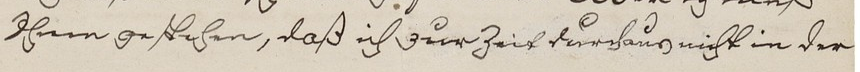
Ihnen gestehen, daß ich zur Zeit durchaus nicht in der
